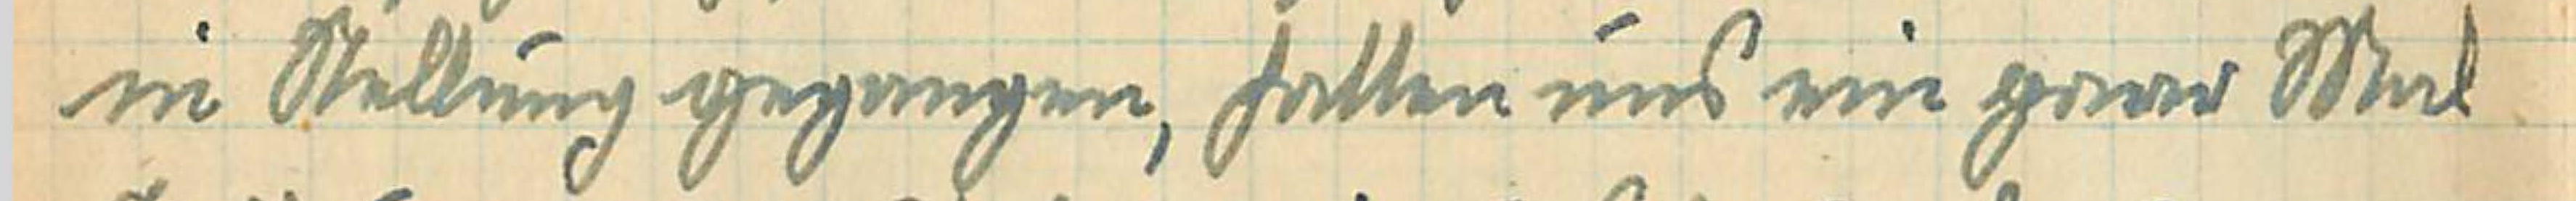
in Stellung gegangen, hatten uns ein paar Mal
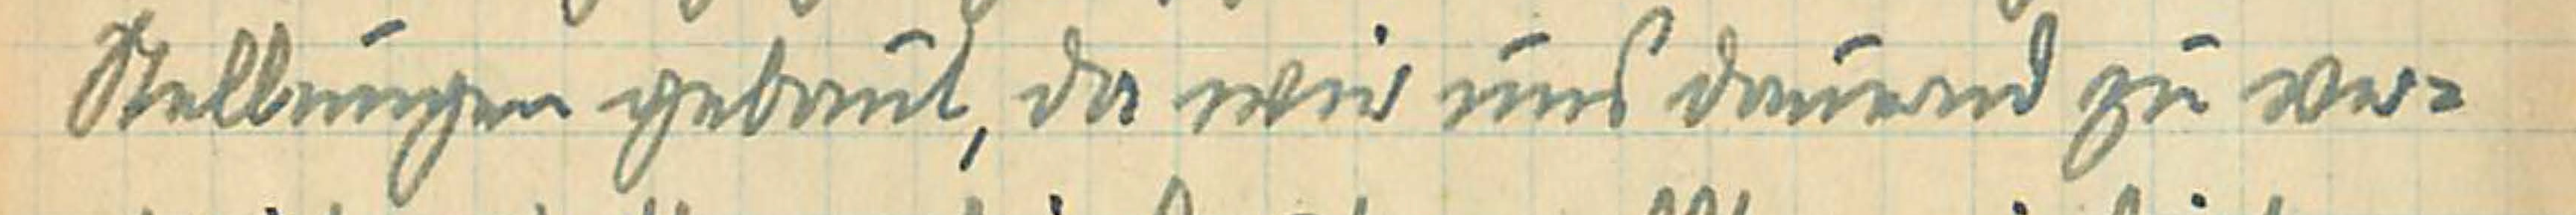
Stellungen gebaut, da wir uns dauernd zu ver-
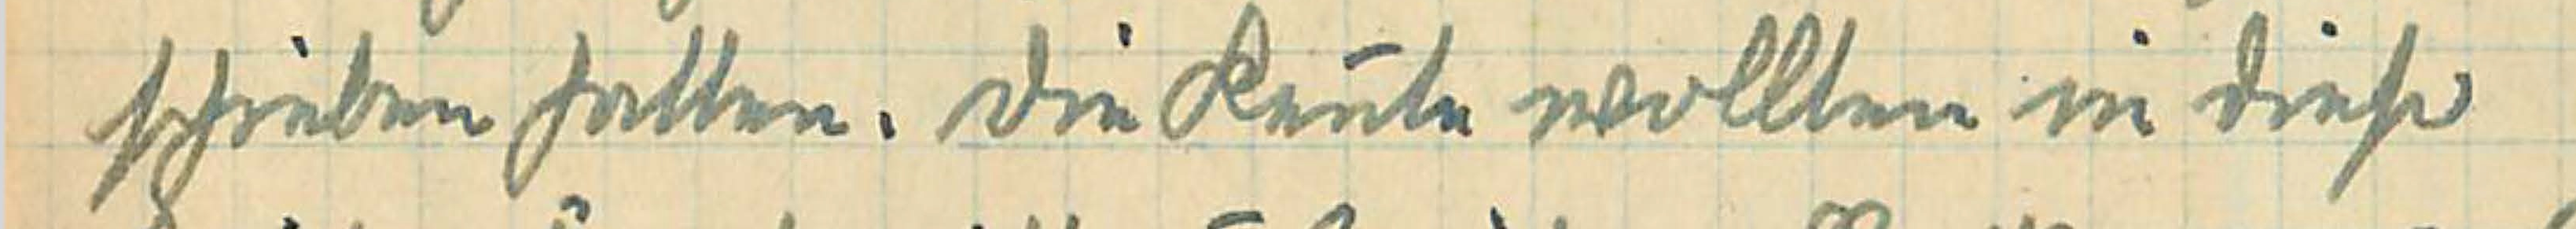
schieben hatten. Die Leute wollten in dieser
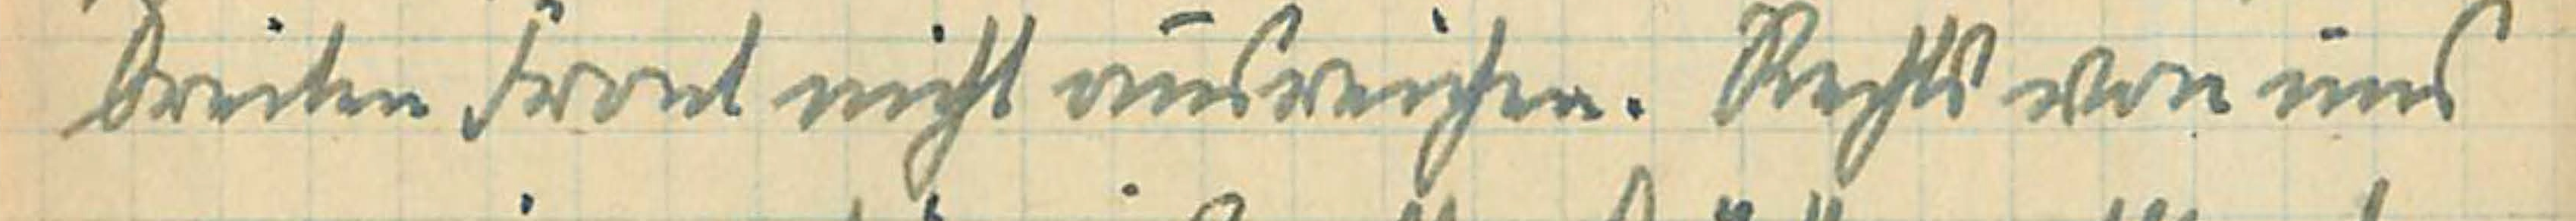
breiten Front nicht ausreichen. Rechts von uns
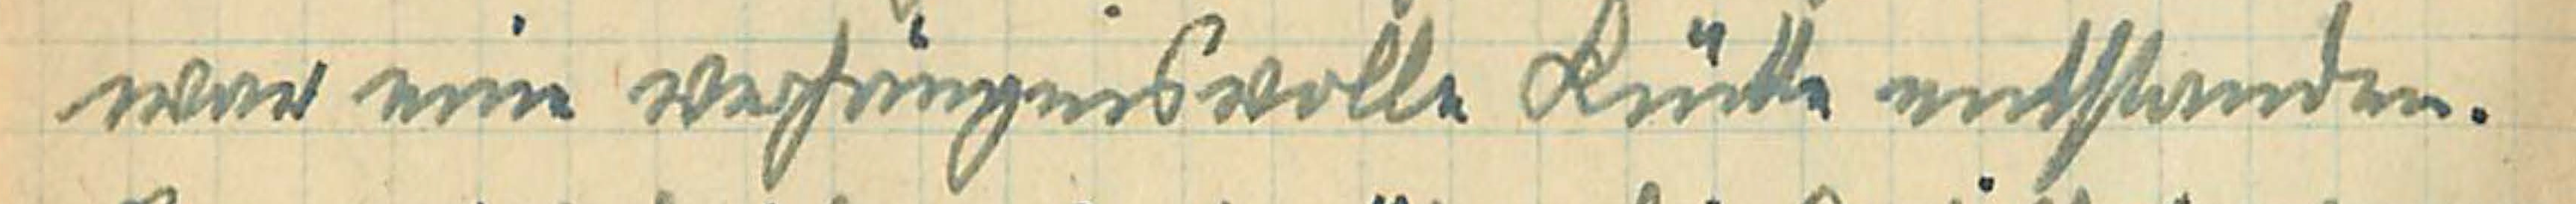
war eine verhängnisvolle Lücke entstanden.
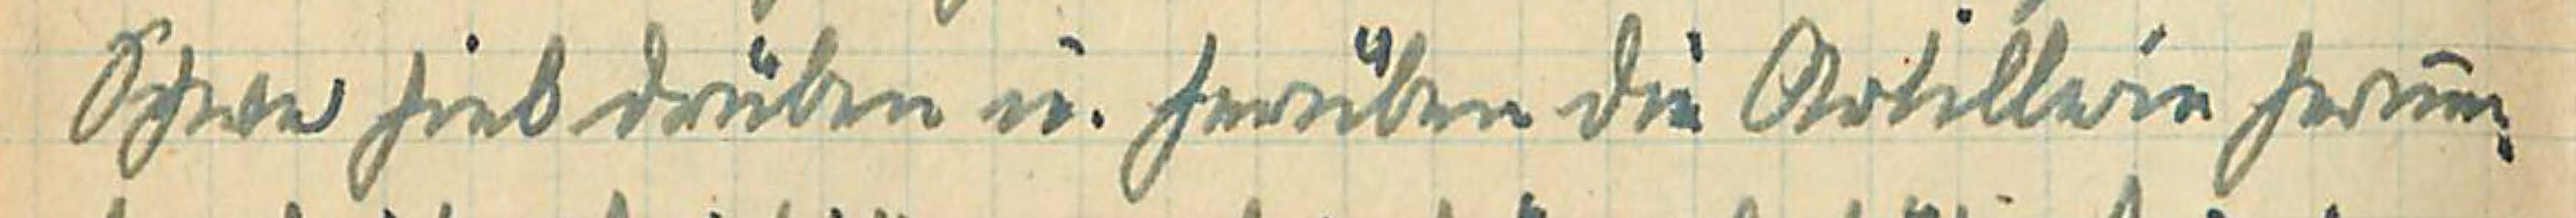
Schwer hieb drüben u. herüben die Artillerie herum.
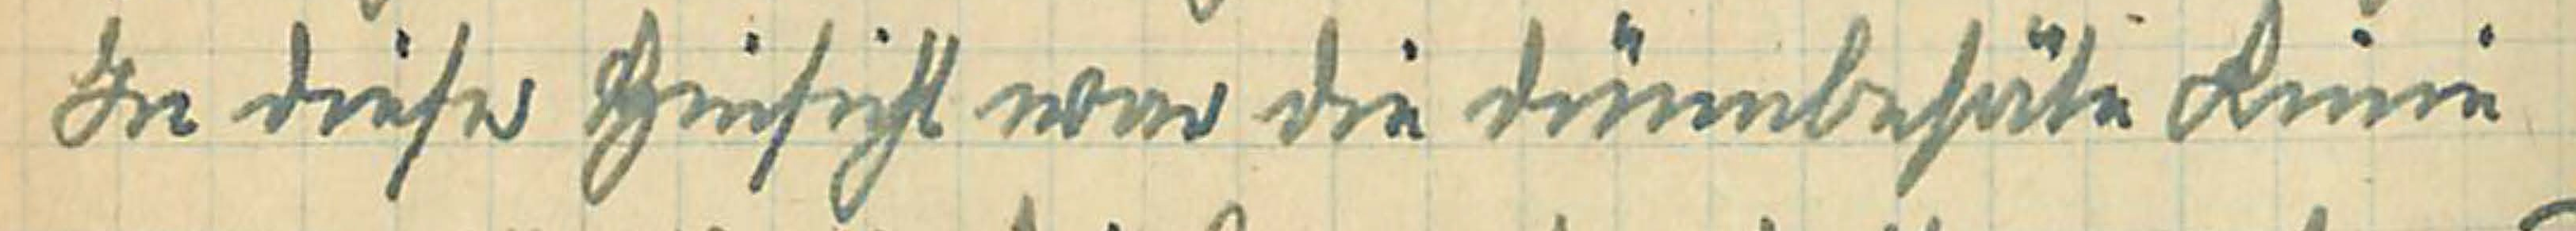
In dieser Hinsicht war die dünnbesäte Linie
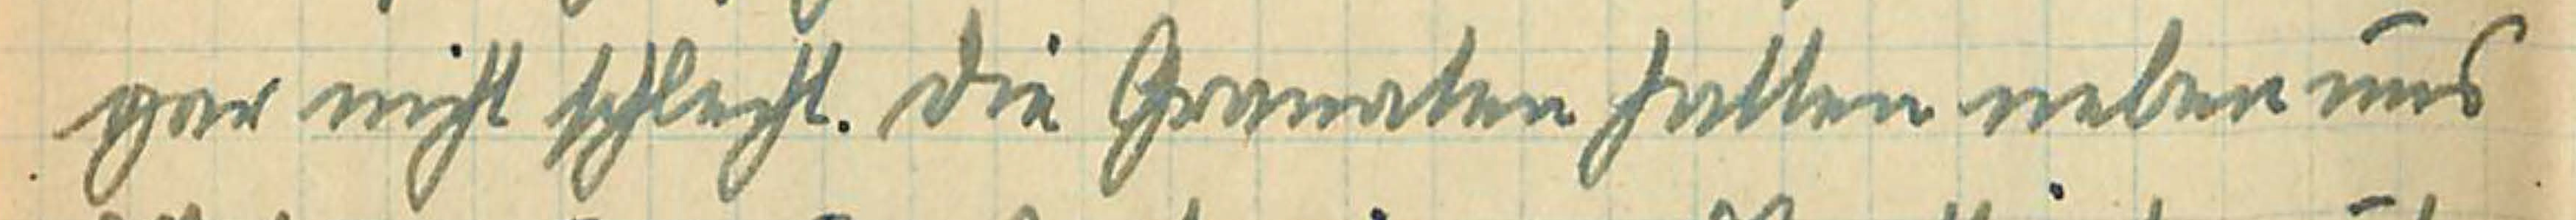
gar nicht schlecht. Die Granaten hatten neben uns
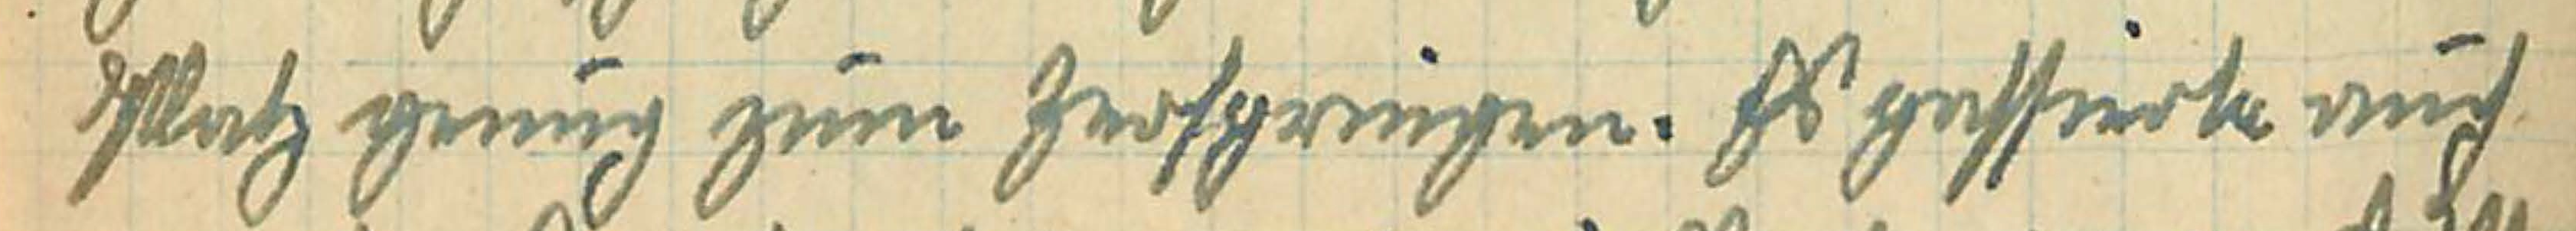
Platz genug zum Zerspringen. Es passierte auch
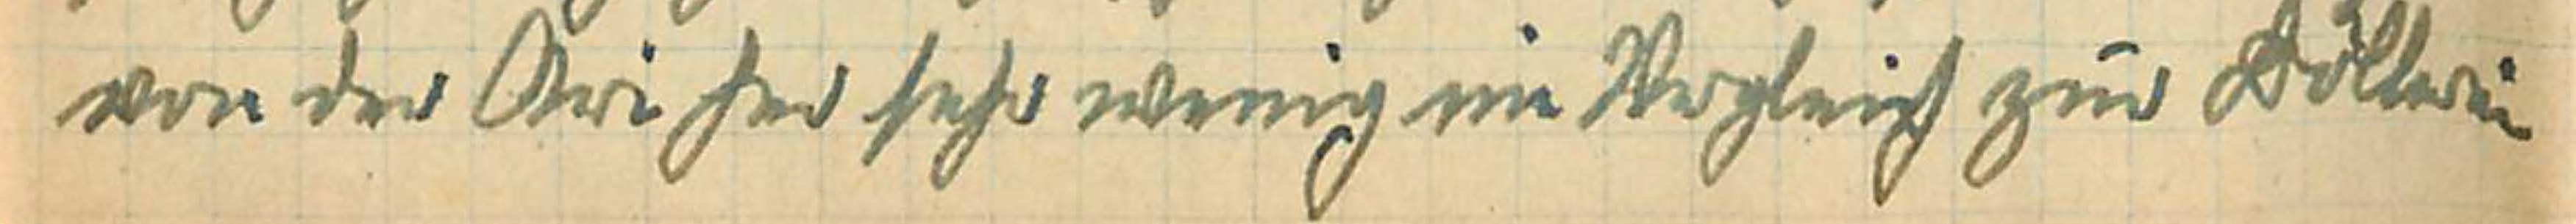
von der Ari her sehr wenig im Vergleich zur Böllerei.
